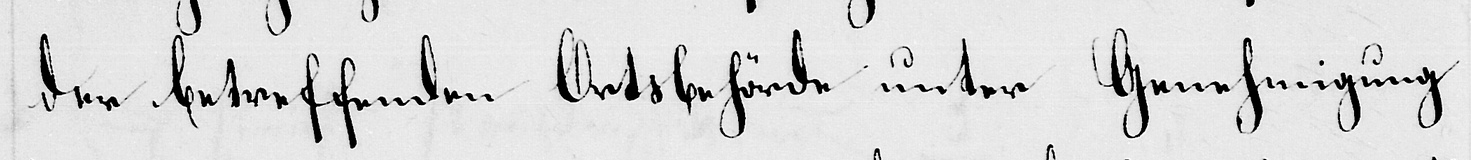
der betreffenden Ortsbehörde unter Genehmigung
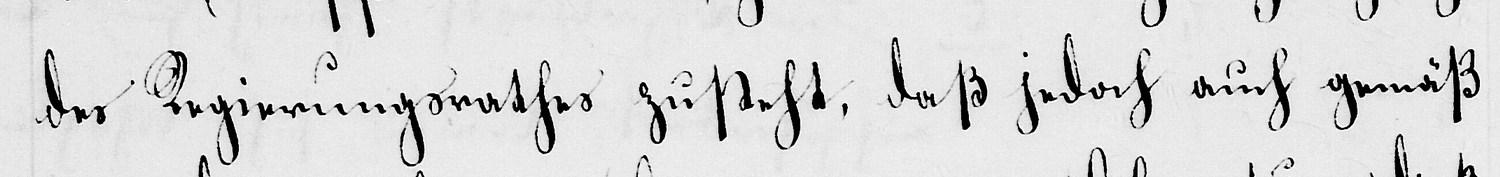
des Regierungsrathes zusteht, daß jedoch auch gemäß
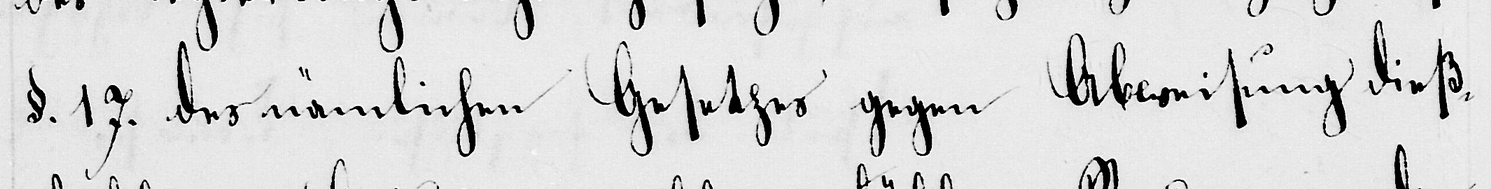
§. 17. des nämlichen Gesetzes gegen Abweisung dieß¬
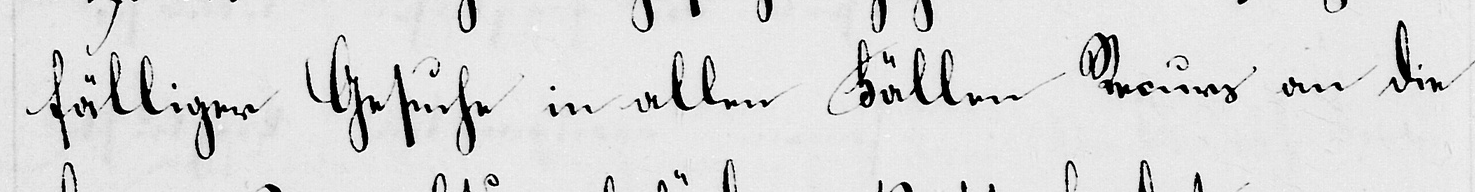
fälliger Gesuche in allen Fällen Recurs an die
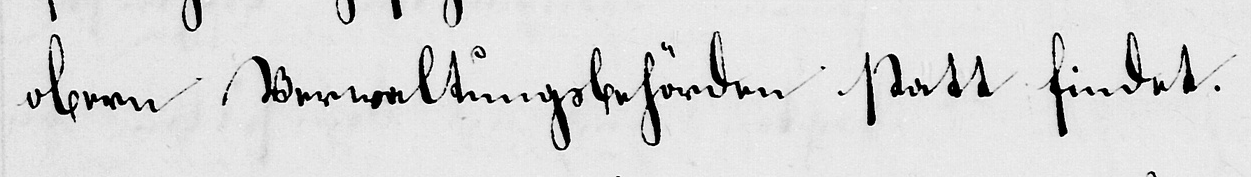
obern Verwaltungsbehörden statt findet.
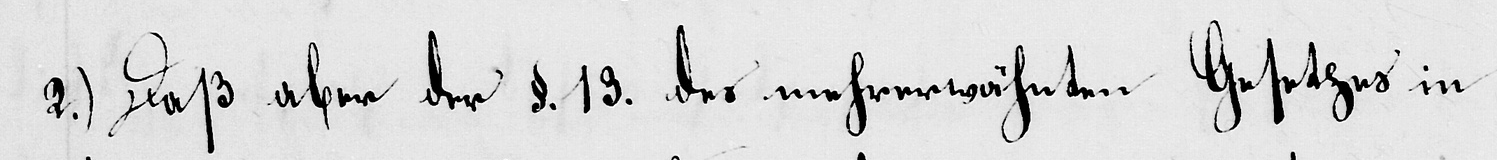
2.) Daß aber der §. 13. des mehrerwähnten Gesetzes in
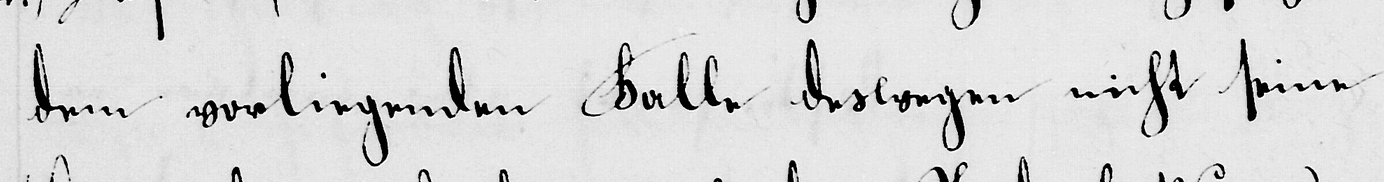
dem vorliegenden Falle deswegen nicht seine
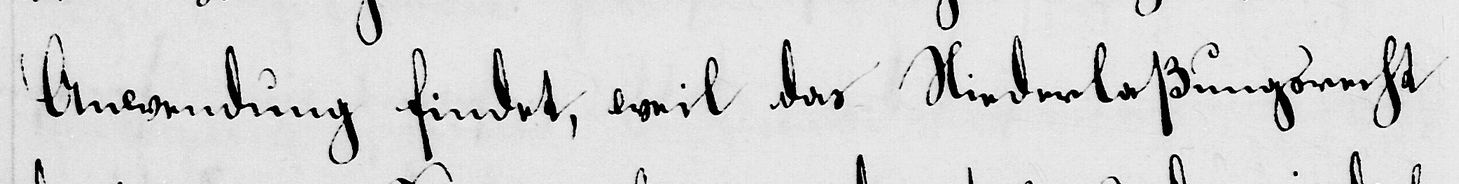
Anwendung findet, weil das Niederlaßungsrecht
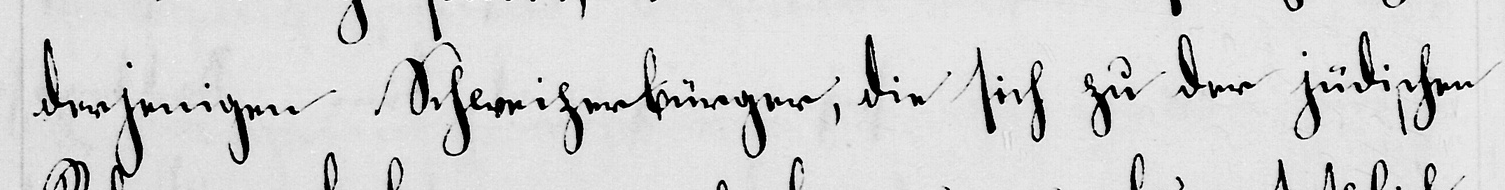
derjenigen Schweizerbürger, die sich zu der jüdischen
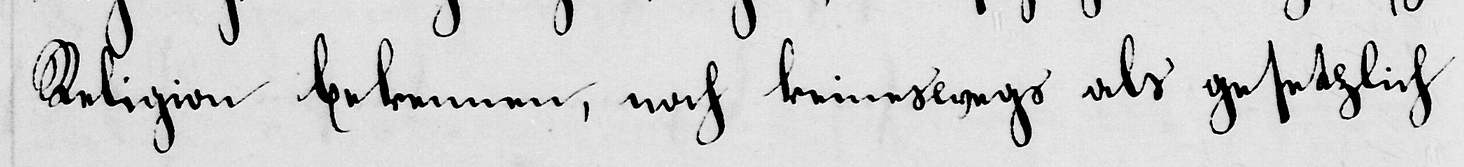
Religion bekennen noch keineswegs als gesetzlich
